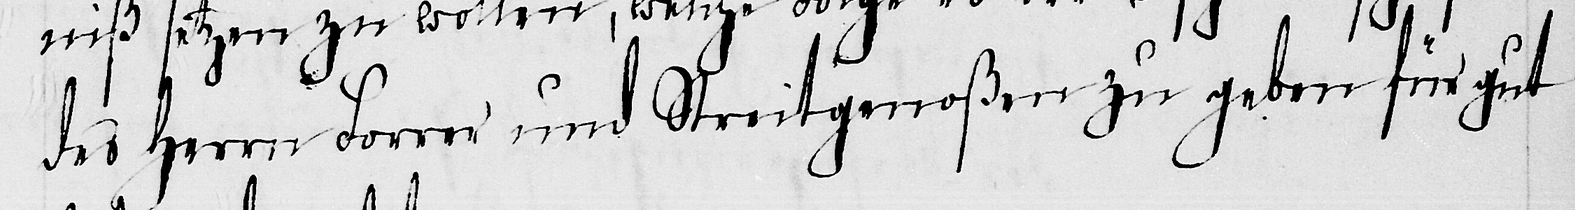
des Herrn Forrer und Streitgenoßen zu geben für gut
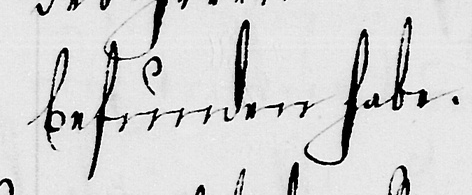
befunden habe.
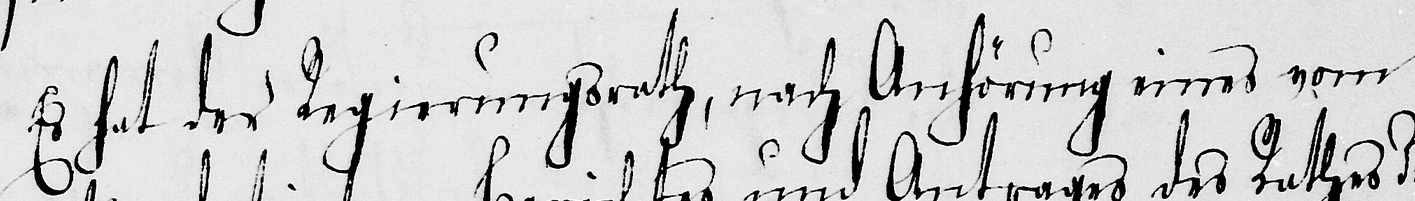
Es hat der Regierungsrath, nach Anhörung eines vom
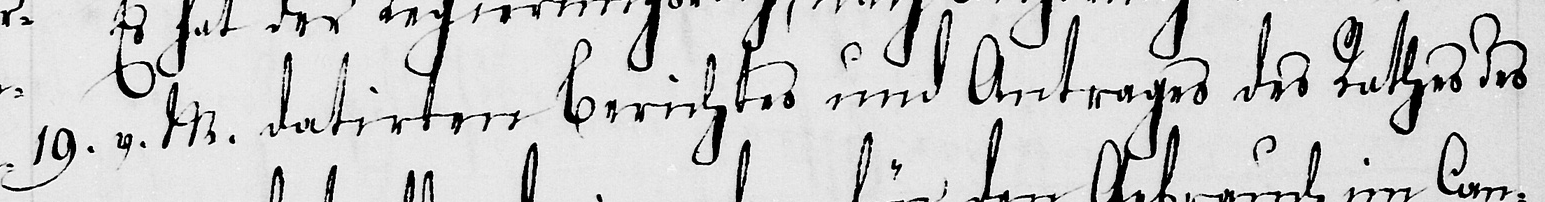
19. v. M. datirten Berichtes und Antrages des Rathes des
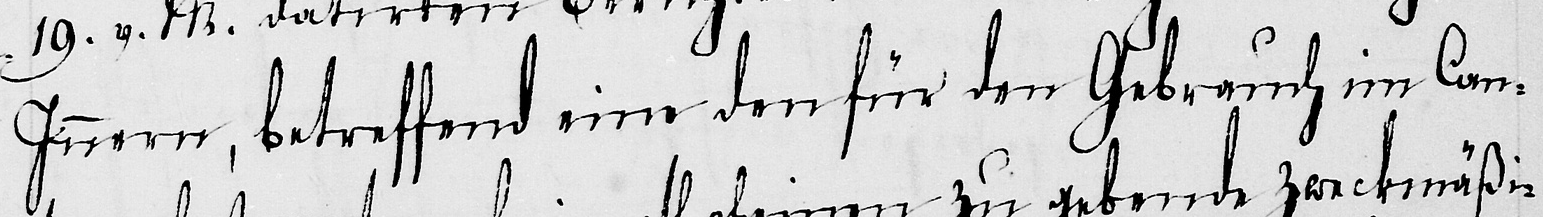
Innern, betreffend eine den für den Gebrauch im Can¬
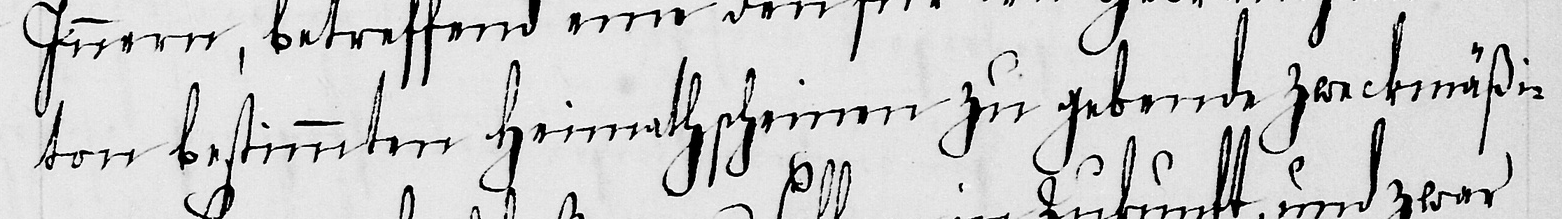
ton bestimmten Heimathscheinen zu gebende zweckmäßi¬
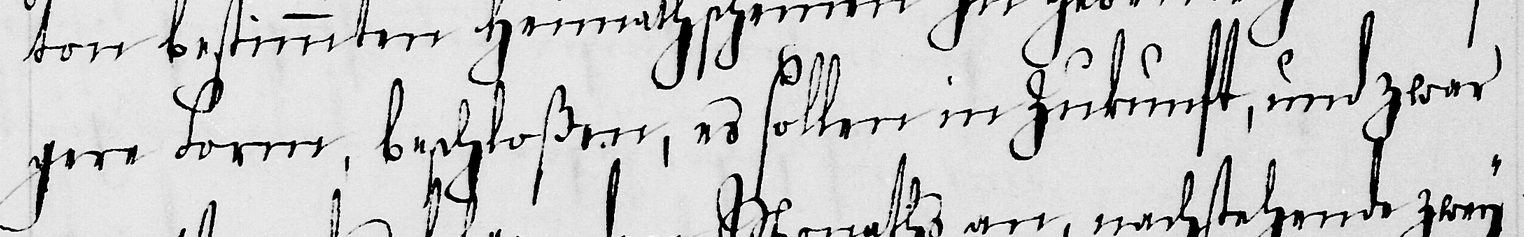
gere Form, beschloßen, es sollen in Zukunft, und zwar
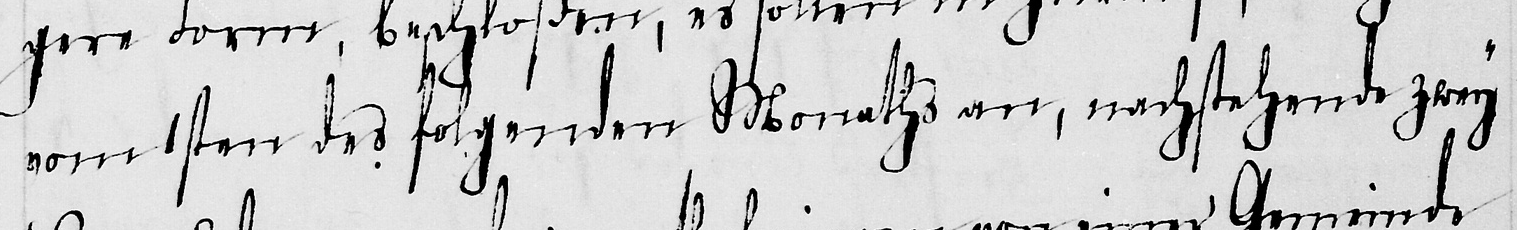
vom 1sten des folgenden Monaths an, nachstehende zwey
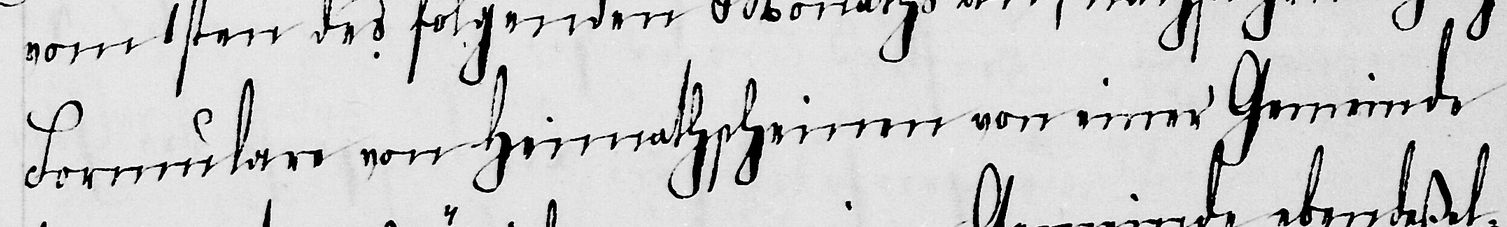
Formulare von Heimathscheinen von einer Gemeinde
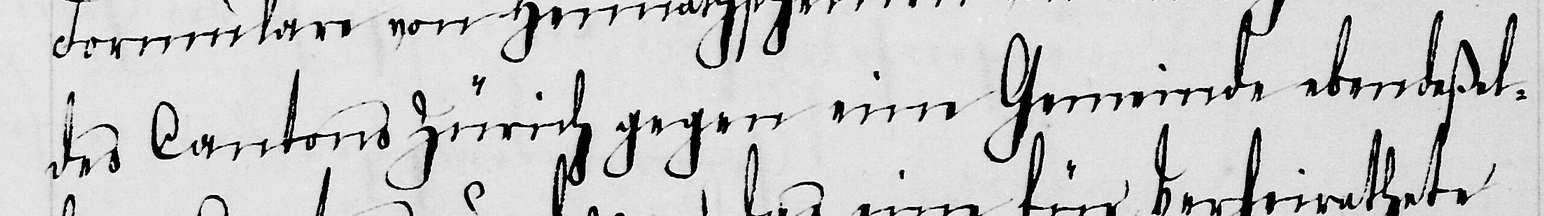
des Cantons Zürich gegen eine Gemeinde ebendeßel¬
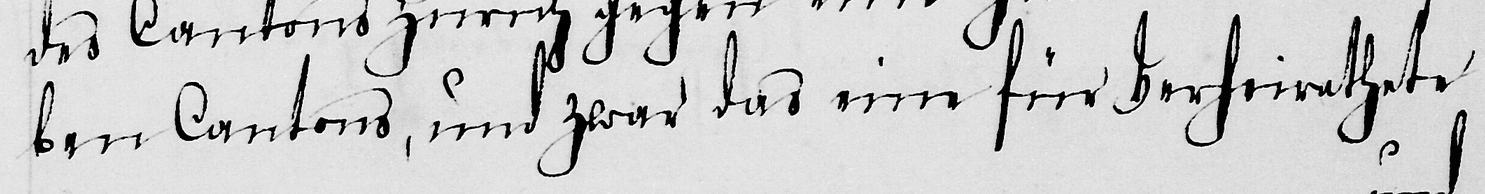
ben Cantons, und zwar das eine für Verheirathete
